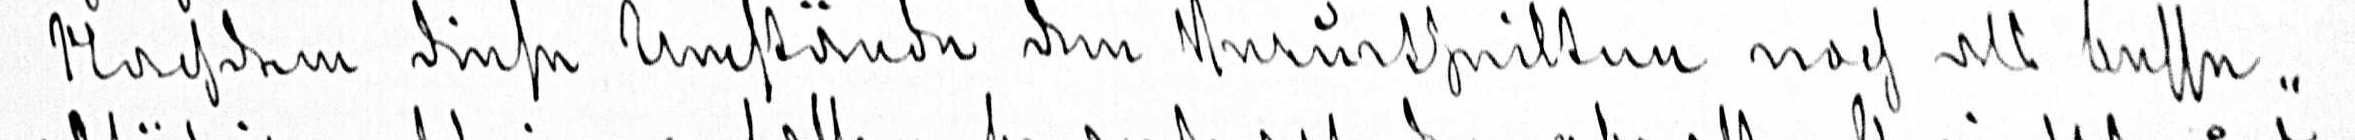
Nachdem diese Umstände den Verurtheilten noch als besse¬
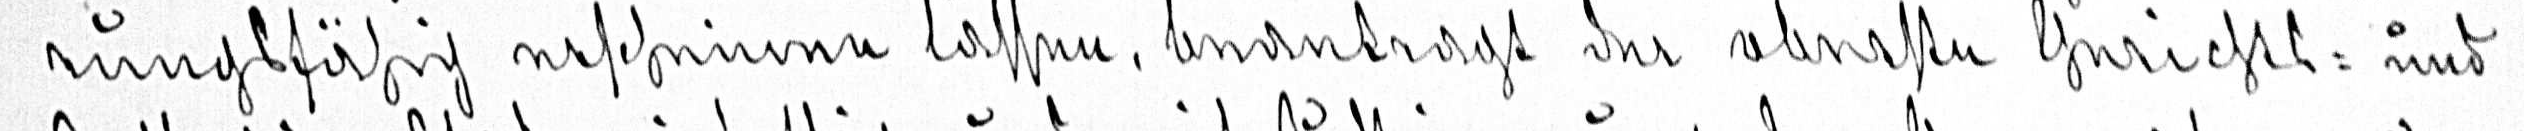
rungsfähig erscheinen lassen, beantragt der oberste Gerichts- und
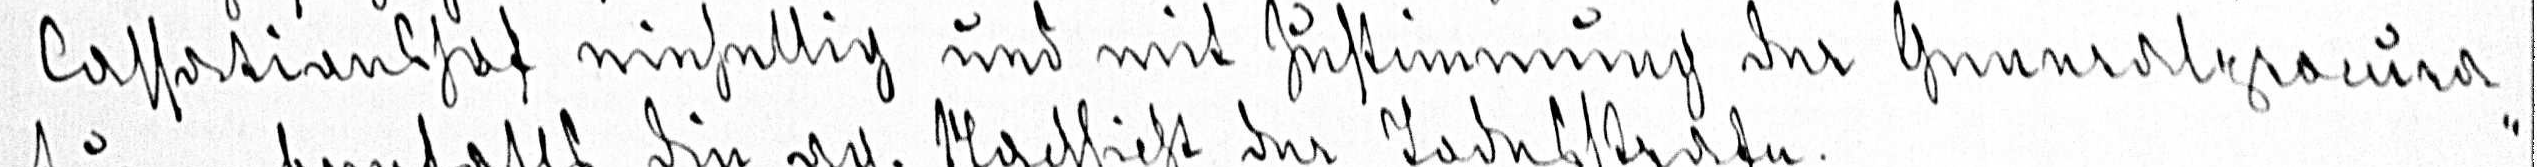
Cassationshof einhellig und mit Zustimmung der Generalprocura¬
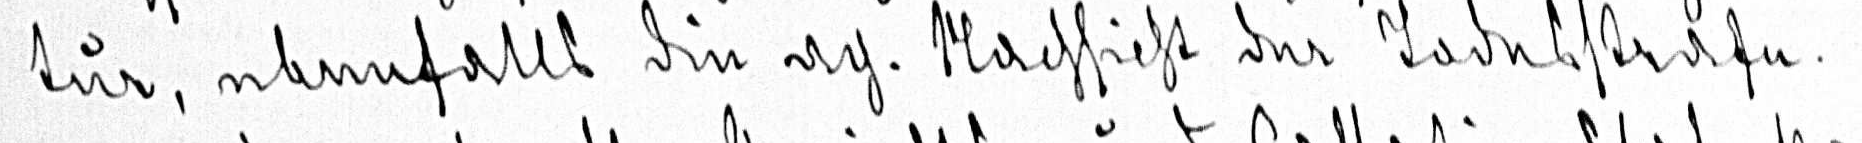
tur, ebenfalls die ag. Nachsicht der Todesstrafe.
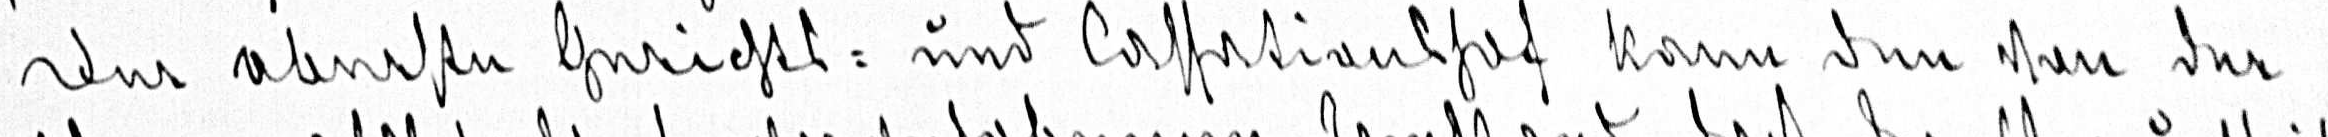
Der oberste Gerichts- und Cassationshof kann den von der
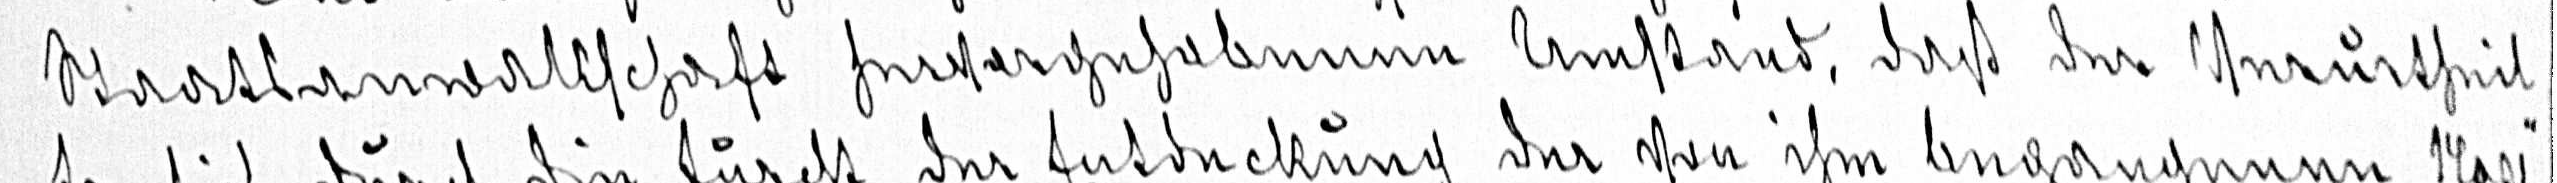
Staatsanwaltschaft hervorgehobenen Umstand, daß der Verurtheil¬
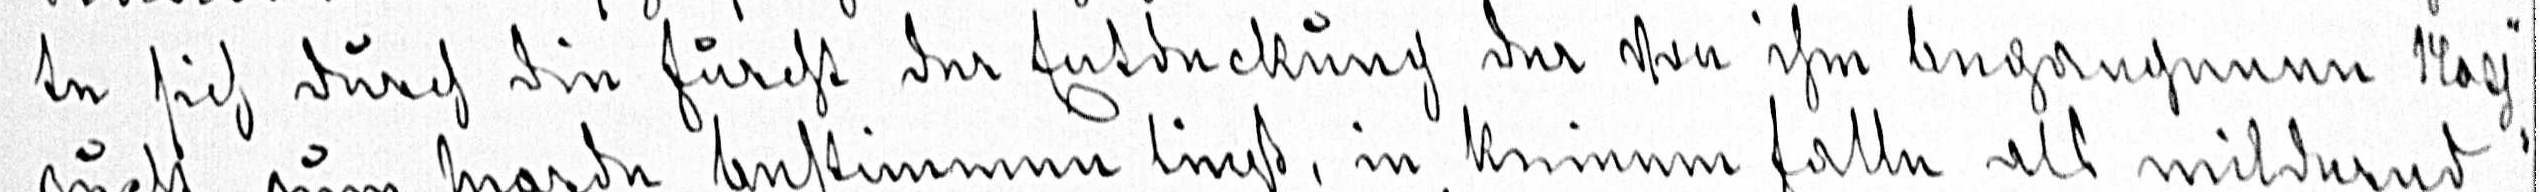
te sich durch die Furcht der Entdeckung der von ihm begangenen Noth¬
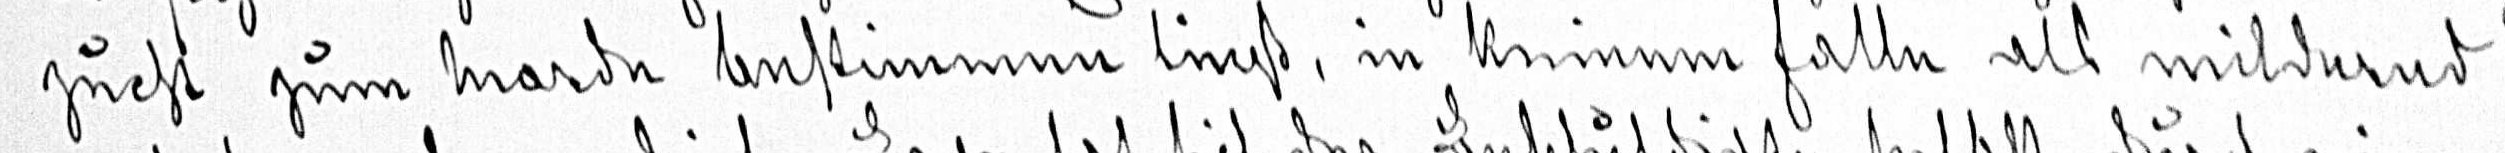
zucht zum Morde bestimmen ließ, in keinem Falle als mildern
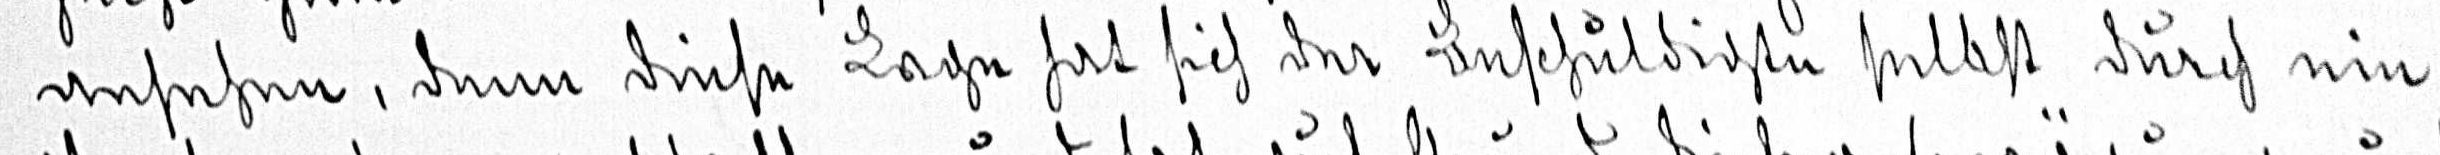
ansehen, denn diese Lage hat sich der Beschuldigte selbst durch ein
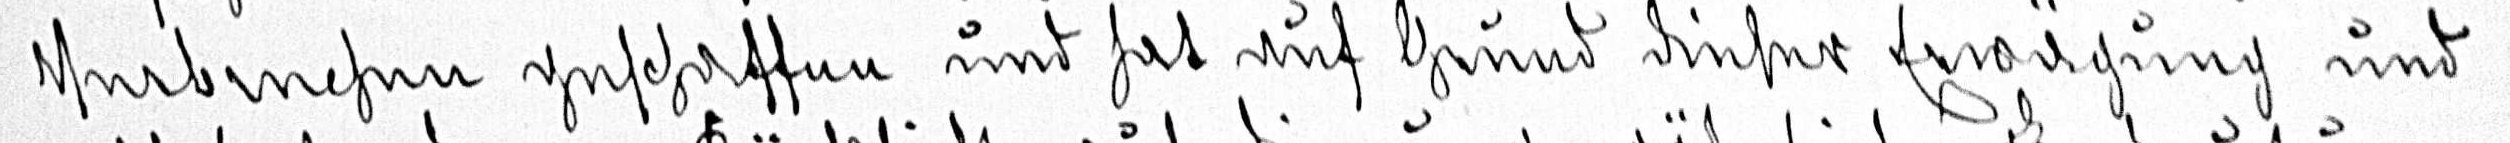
Verbrechen geschaffen und hat auf Grund dieser Erwägung und
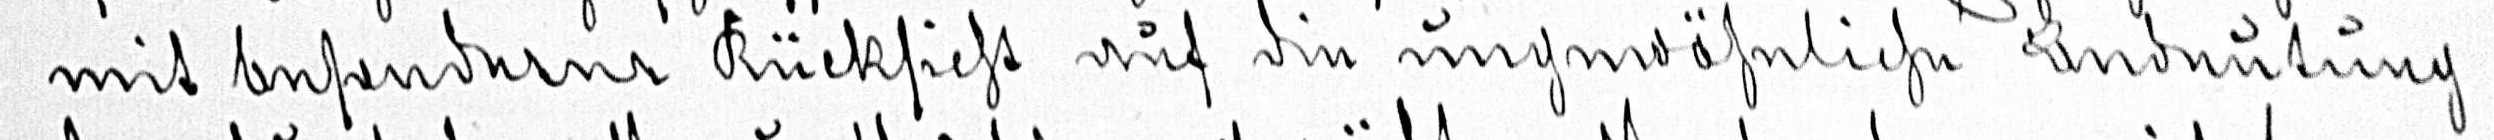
mit besonderer Rücksicht auf die ungewöhnliche Bedeutung
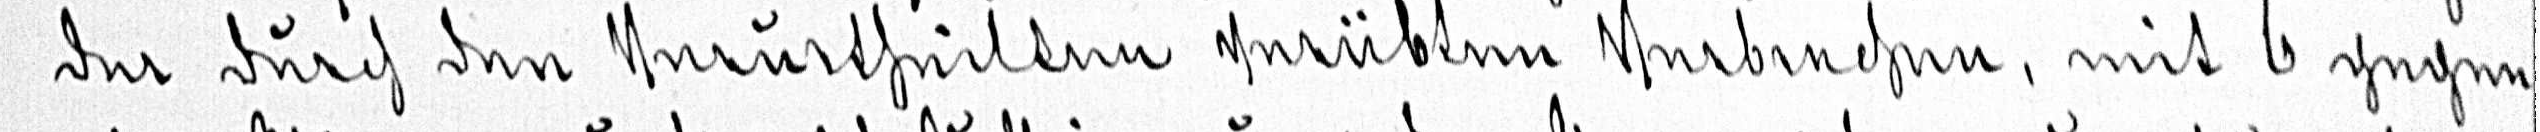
der durch den Verurtheilten verübten Verbrechen, mit 6 gegen
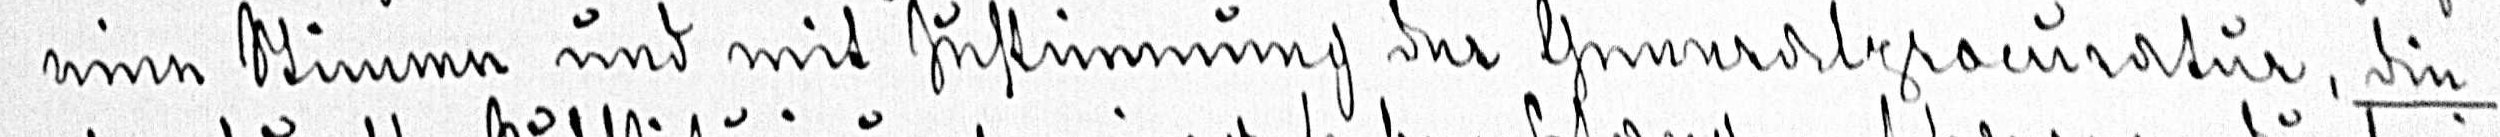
eine Stimme und mit Zustimmung der Generalprocuratur, die
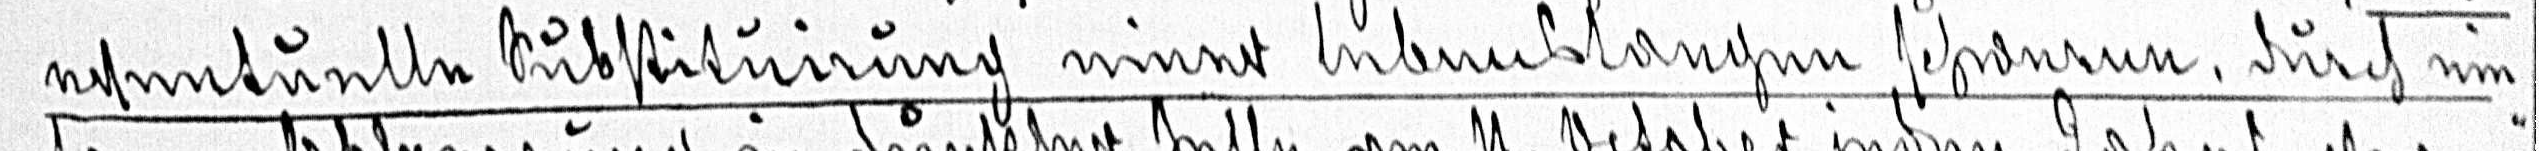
eventuelle Substituirung einer lebenslangen schweren, durch ein¬
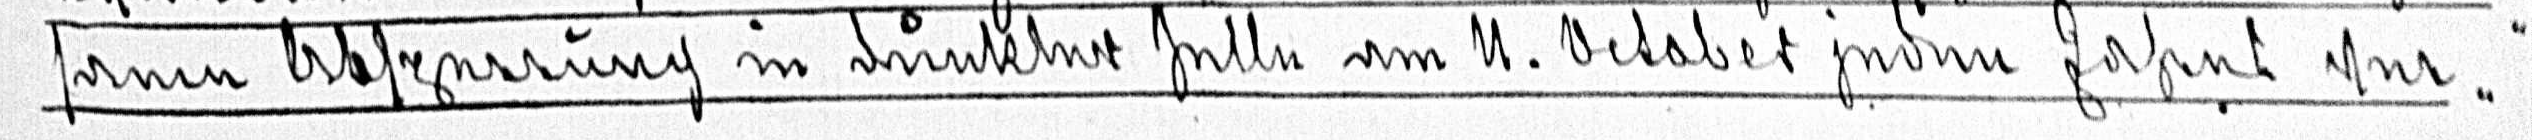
same Absperrung in dunkler Zelle am 11. October jeden Jahres ver¬
